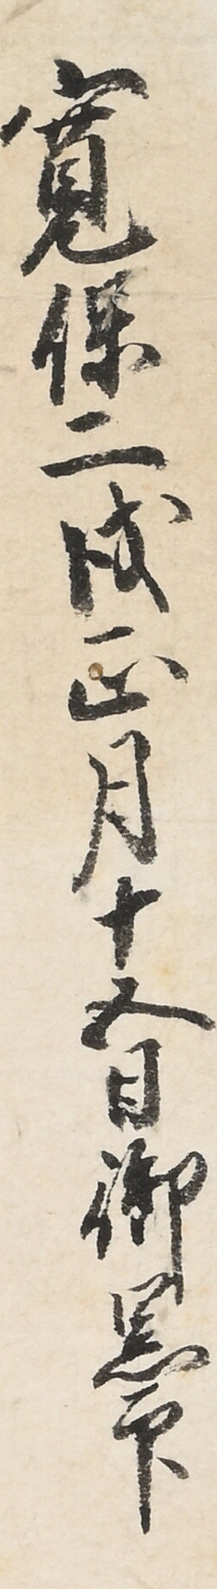寛保二戌正月十五日御黒印
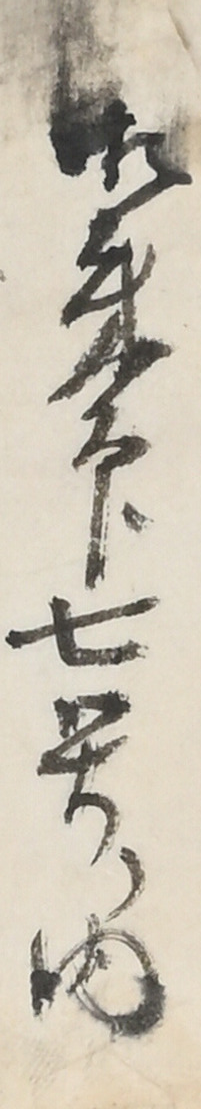御朱印七号ノ内
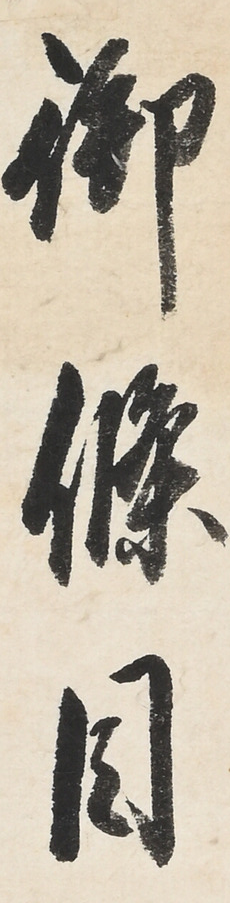御條目

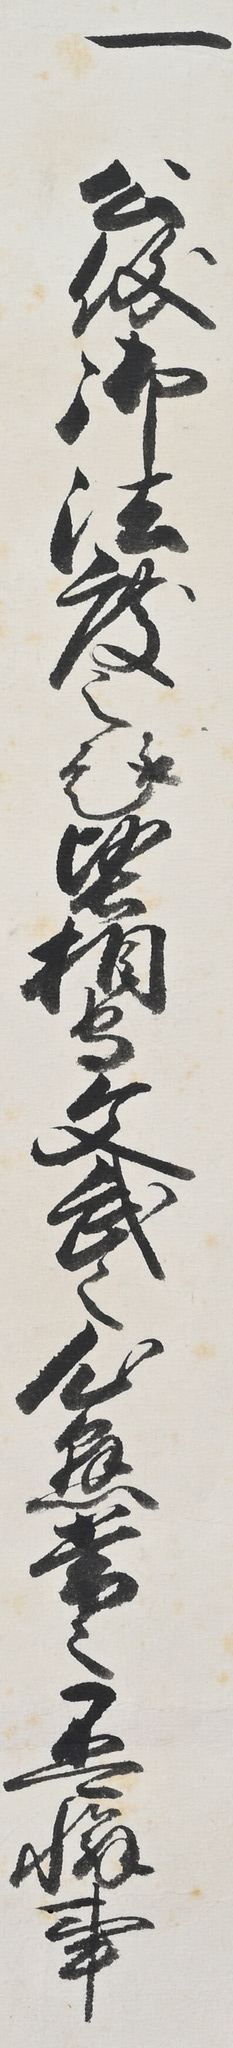一公儀御法度之趣堅相守文武之心懸常々不可懈事
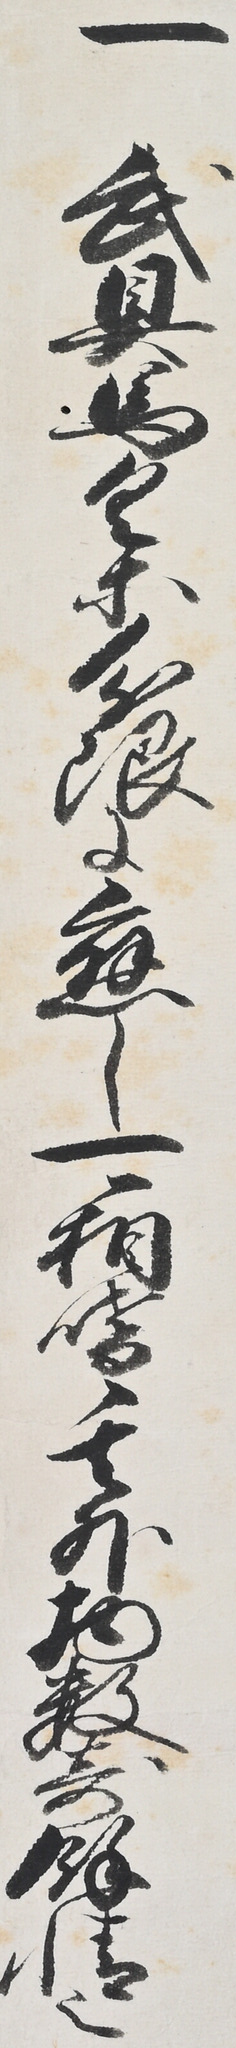一武具馬具等分限に応し可相嗜其外物数寄余情之
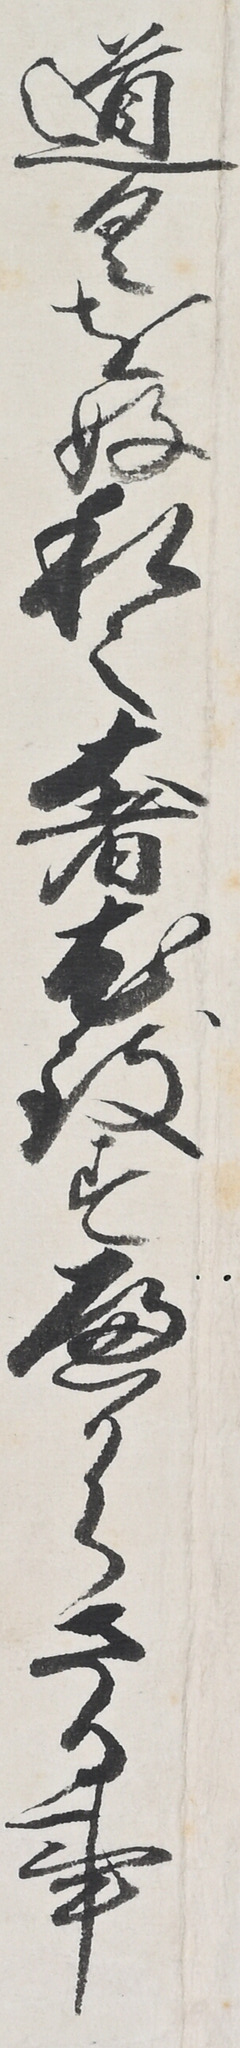道具を好私之奢尤致すへからさる事
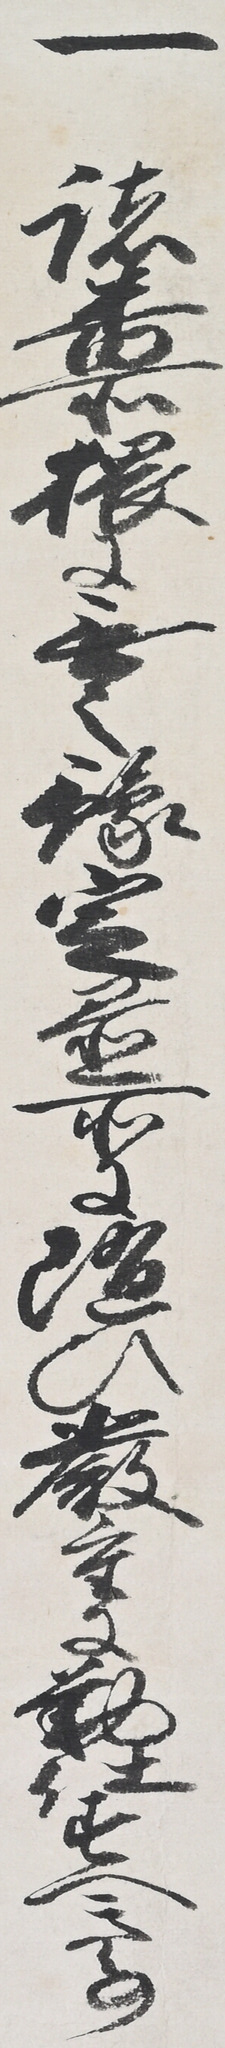一諸番所猥に無之予定置所に随ひ厳重に勤仕すへき事
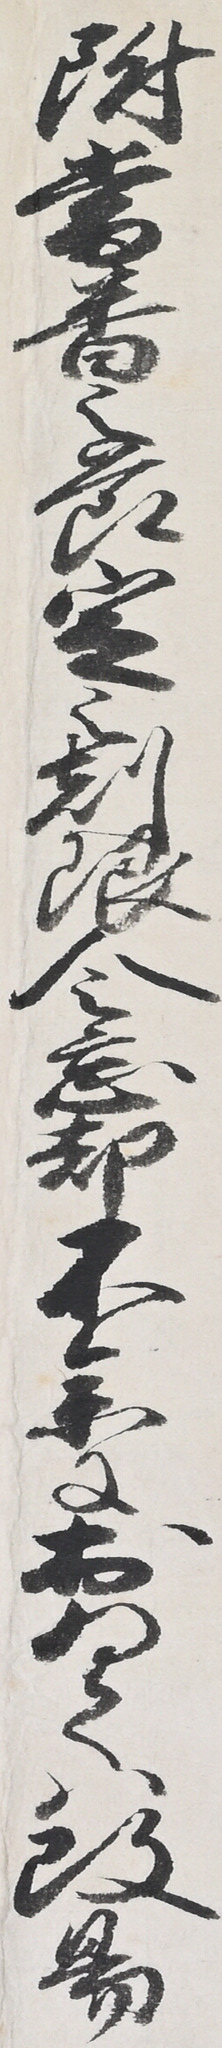附当番之節定之刻限令忘却不参におゐてハ改易
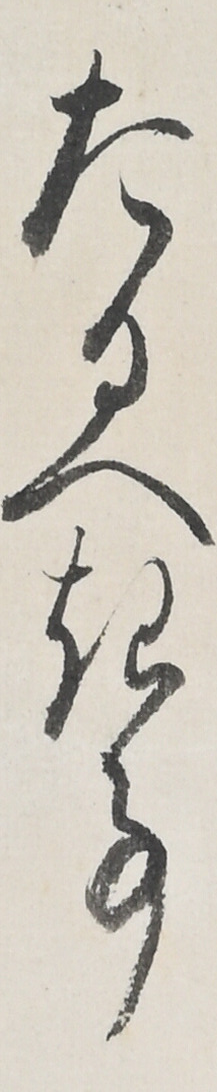たるへき事
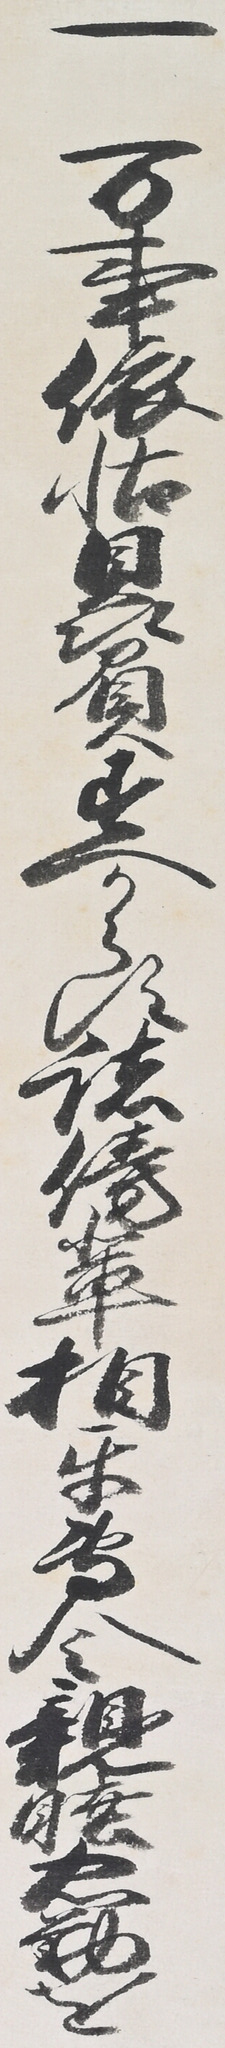一万事依怙贔屓すへからす諸傍輩相互専令親睦忠勤を
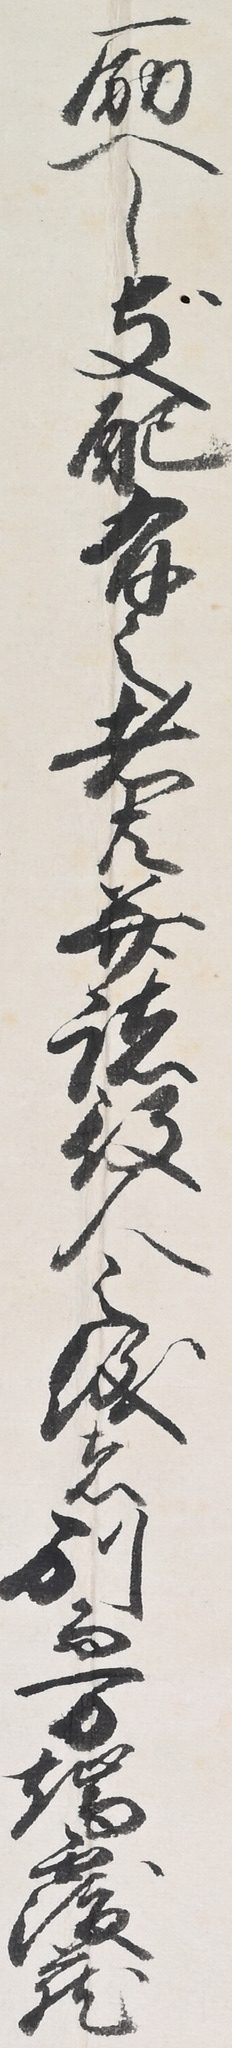励へし支配有之者共幷諸役人之儀者別而万端覆蔵
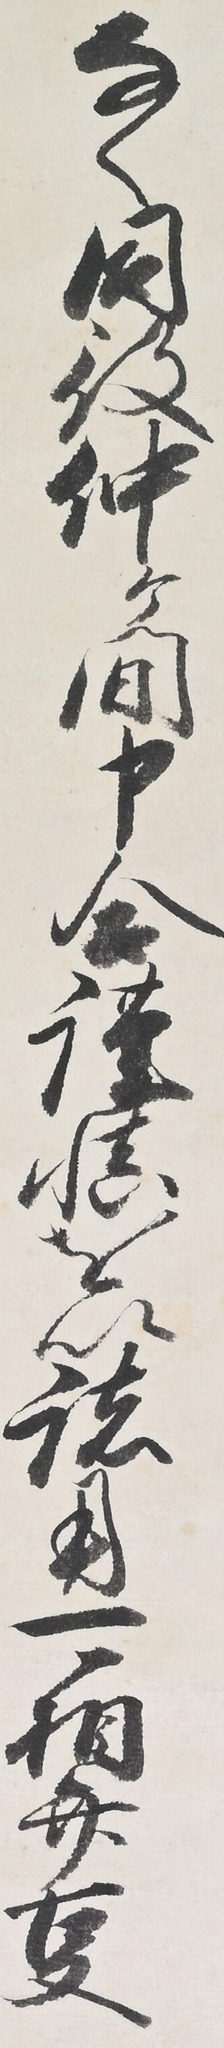なく同役仲ヶ間申合謹慎を以諸用可相弁事
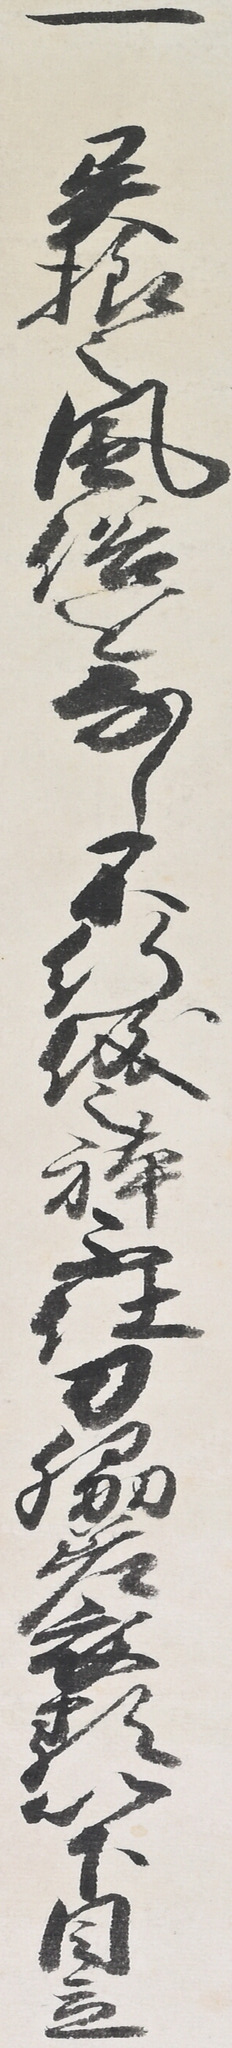一異様之風俗をなし不行儀之躰不仕刀脇差衣類以下目立

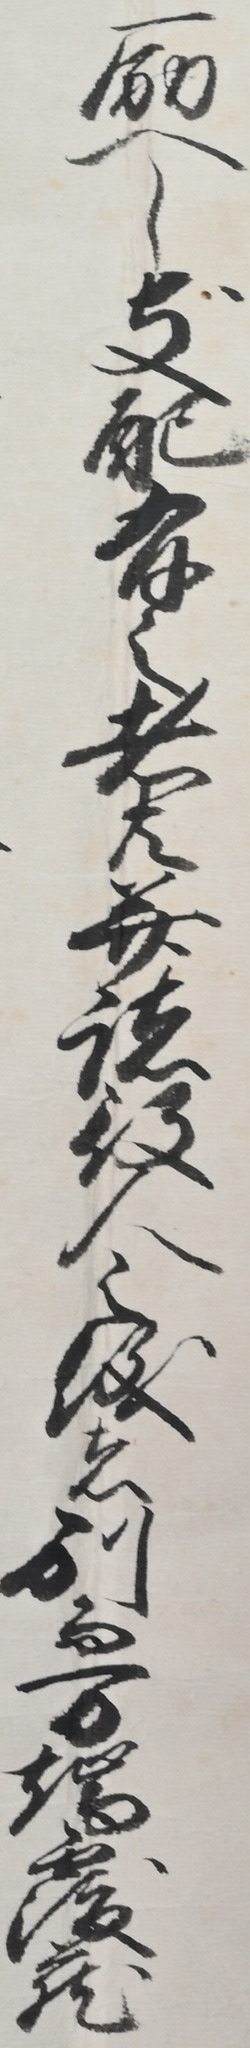励へし支配有之者共幷諸役人之儀者別而万端覆蔵
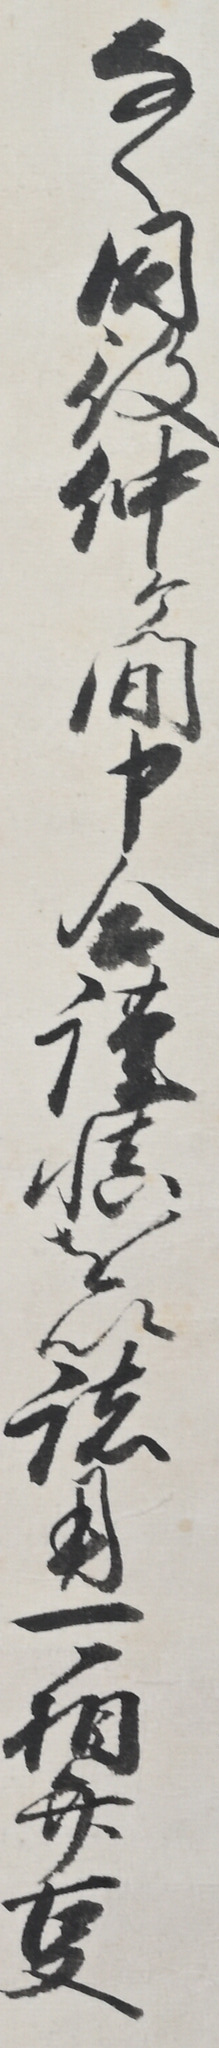なく同役仲ヶ間申合謹慎を以諸用可相弁事
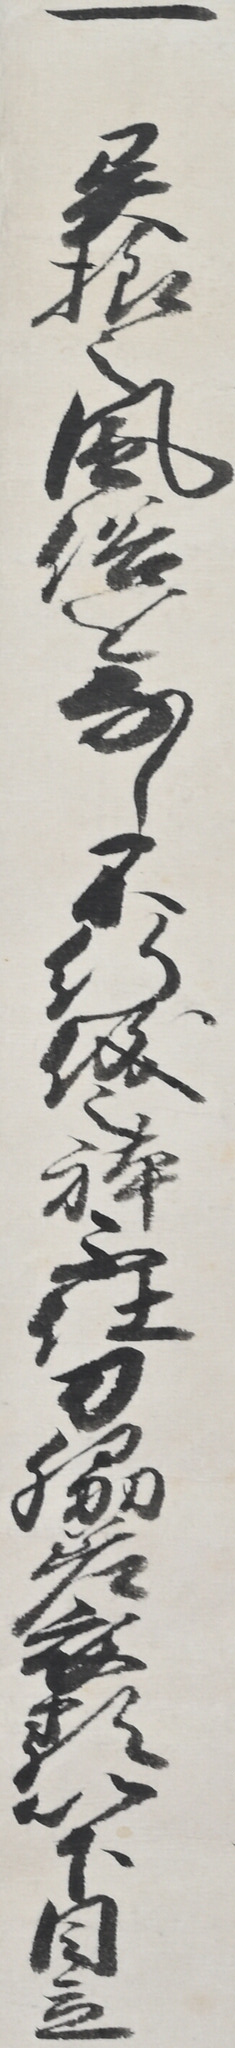一異様之風俗をなし不行儀之躰不仕刀脇差衣類以下目立
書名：御条目〔同文二通一括〕
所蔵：伊那市立高遠町図書館・合同会社AMANE
